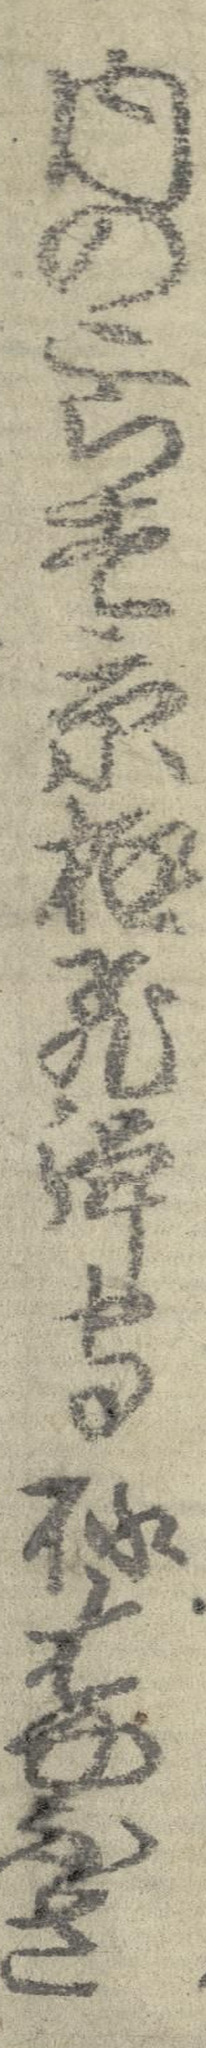内のこらす京極飛騨守様はやふさ
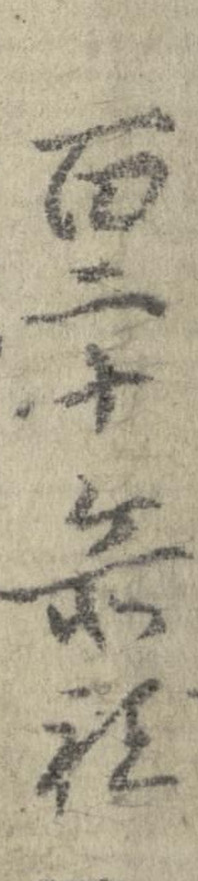百二十ケ所程
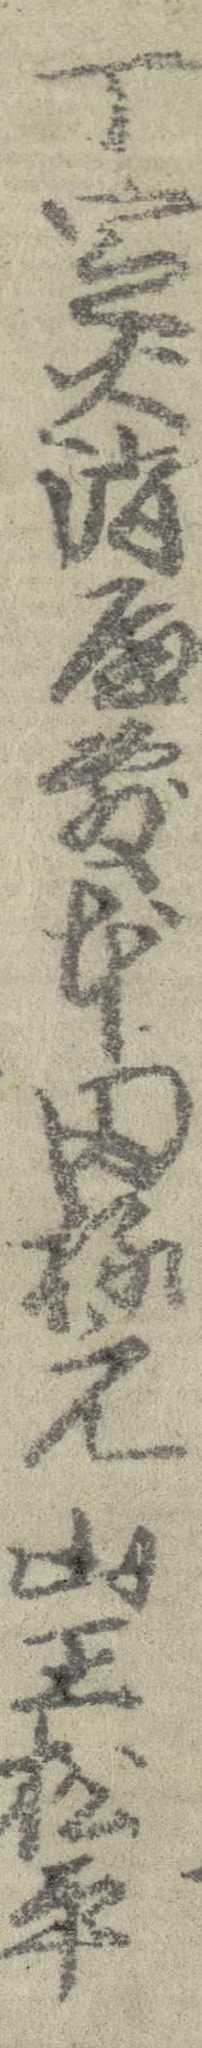丁定火消屋敷本田様元山王松平
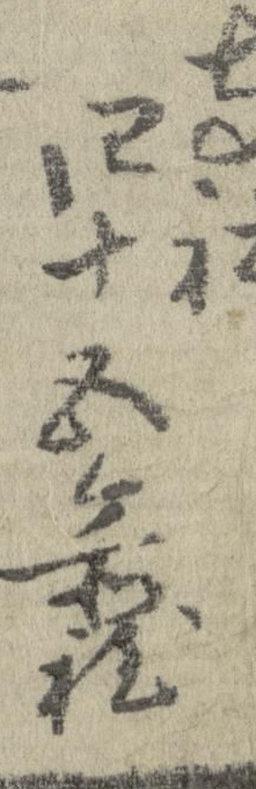四十五ケ所程
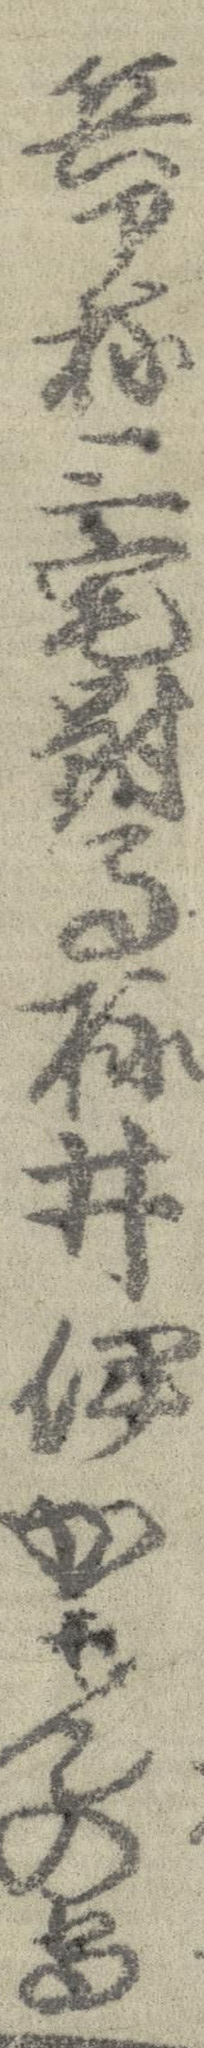兵部様三宅対馬様井伊かもんの守
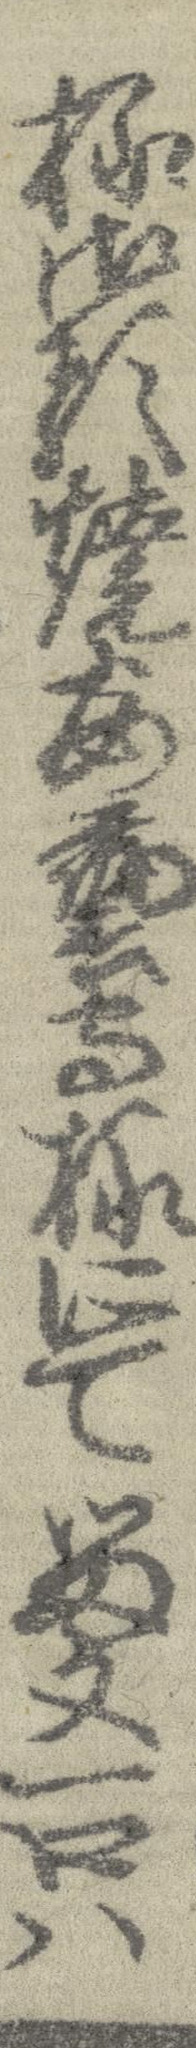様御類焼安芸守様にて留又一口は
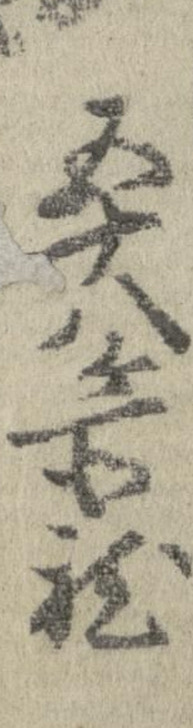五十八ケ所程
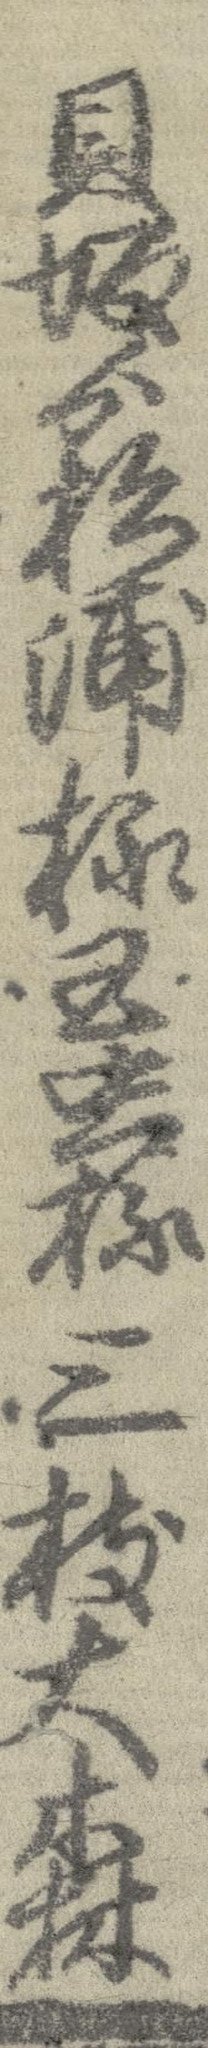貝坂ゟ松浦様国谷様三枝大森
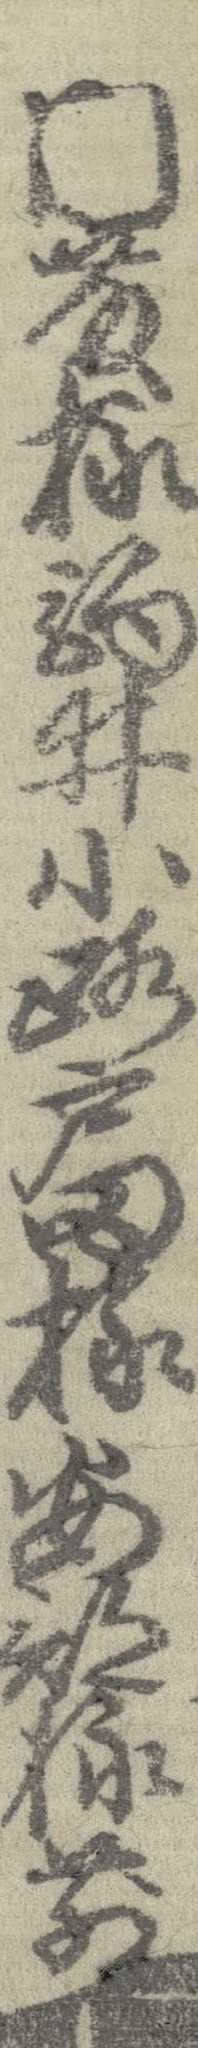内藤様福井小路戸田様安部様前
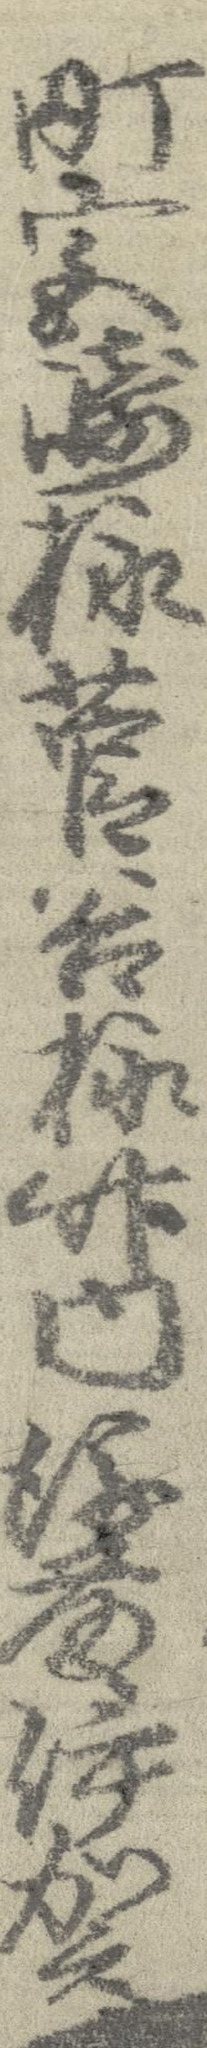町宮崎様菅谷様竹内様藤伊賀
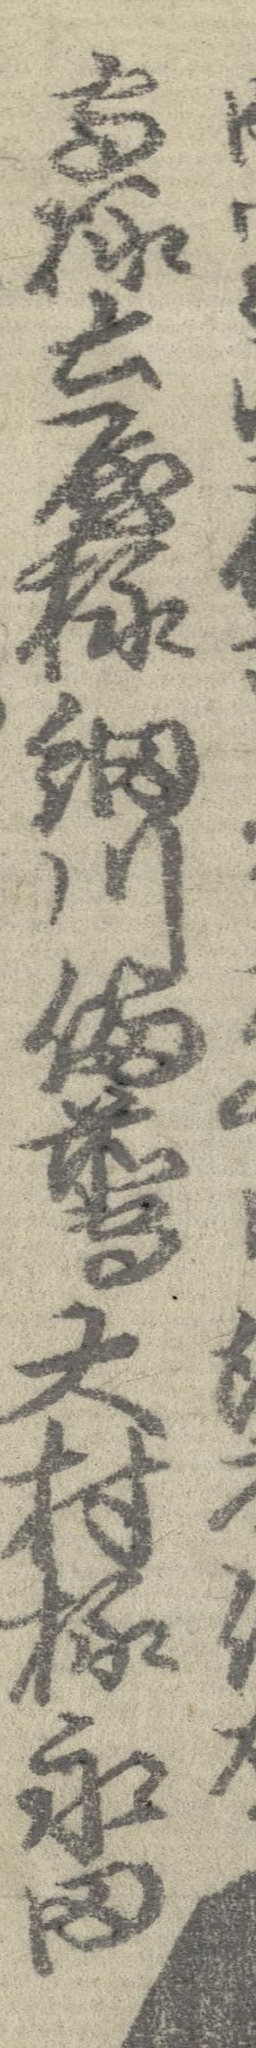守様土屋様細川備前守大村様永田
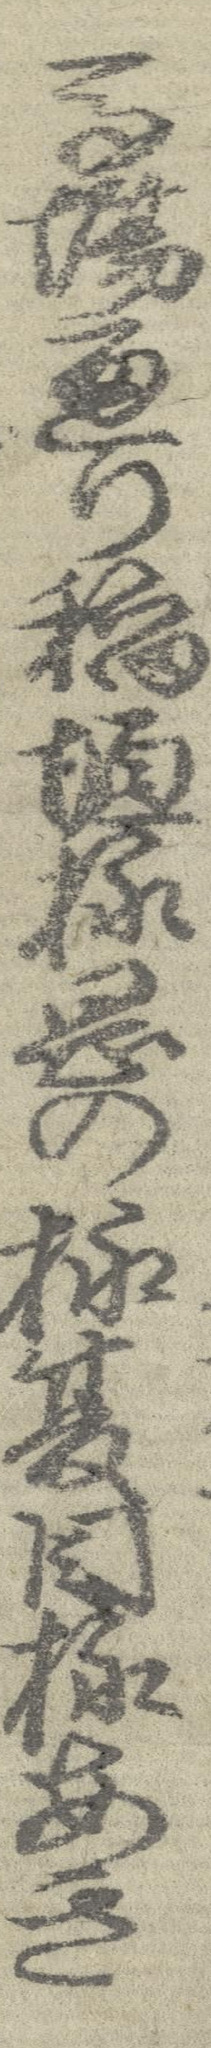馬場通り稲垣様岡の様夏目様あき
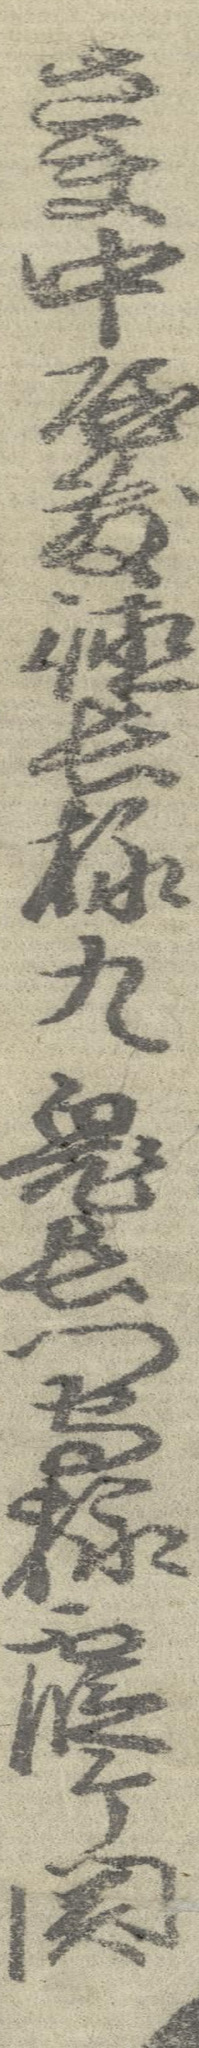さま中屋敷徳長様九鬼長門守様霞ケ関
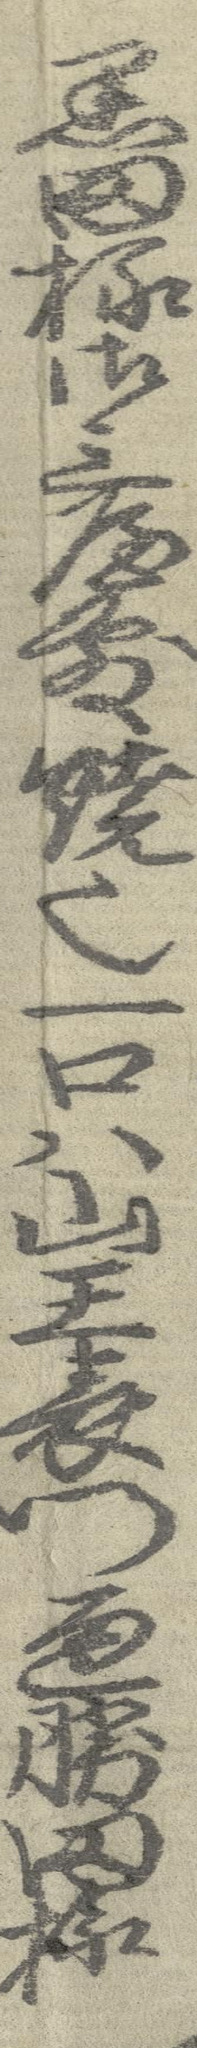黒田様御上屋敷焼也一口は山王表門通勝田様
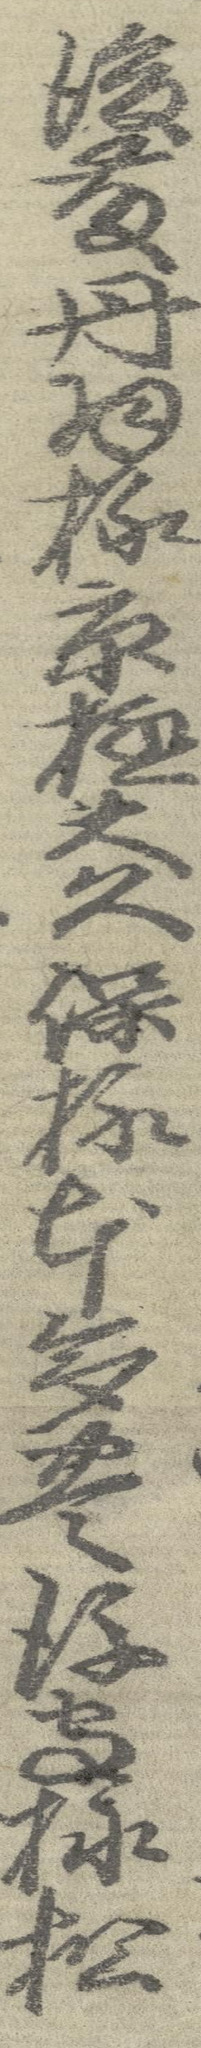後藤丹羽様京極大久保様本多豊後守様松
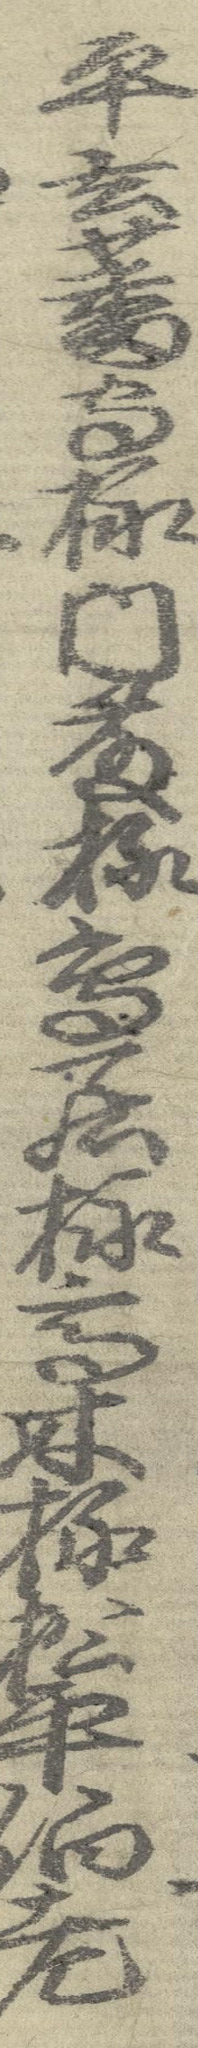平玄蕃守様内藤様鳥居様高木様松平伯老
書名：[嘉永三年二月の江戸大火に関する瓦版]
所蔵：東京大学地震研究所図書室 Earthquake Research Institute Library, The University of Tokyo, JAPAN
